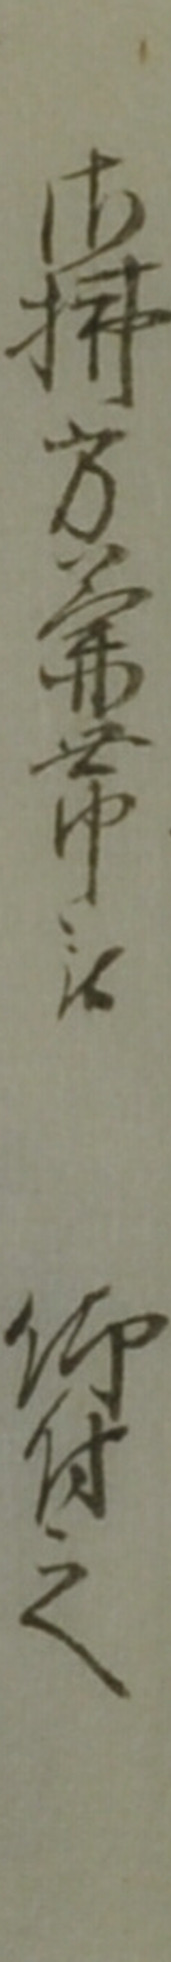御払方兼帯被仰付之
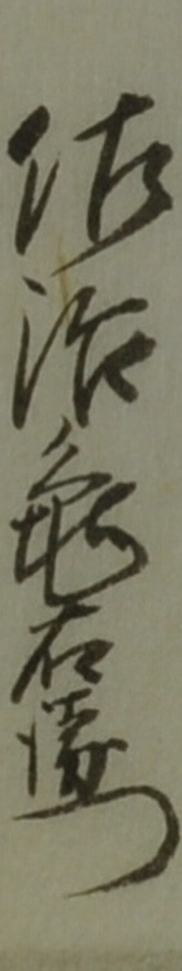佐治亀右衛門
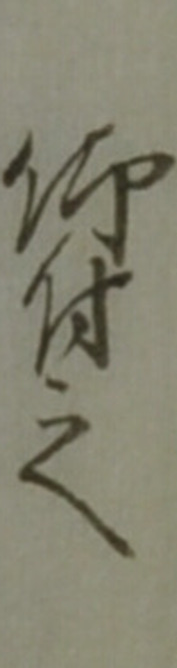仰付之
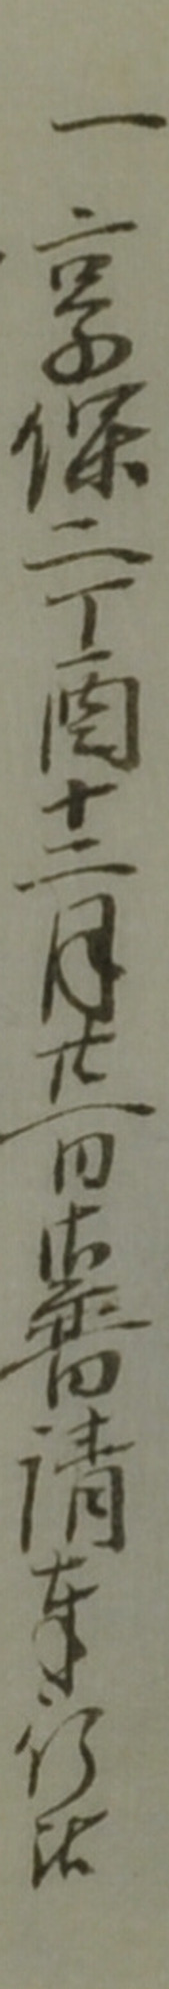一享保二丁酉十二月廿一日御普請奉行被
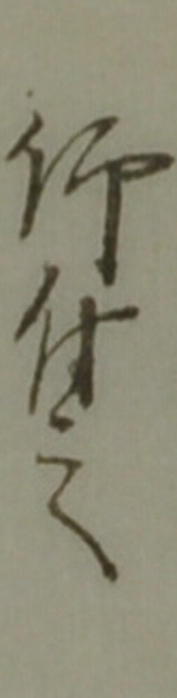仰付之
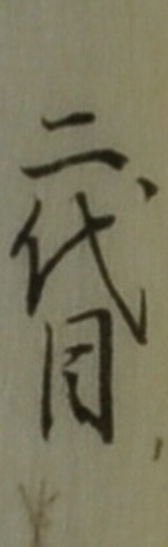二代目
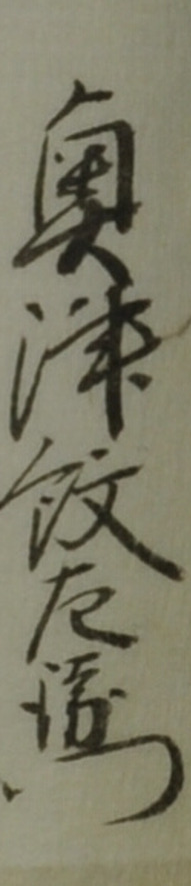奥津紋左衛門
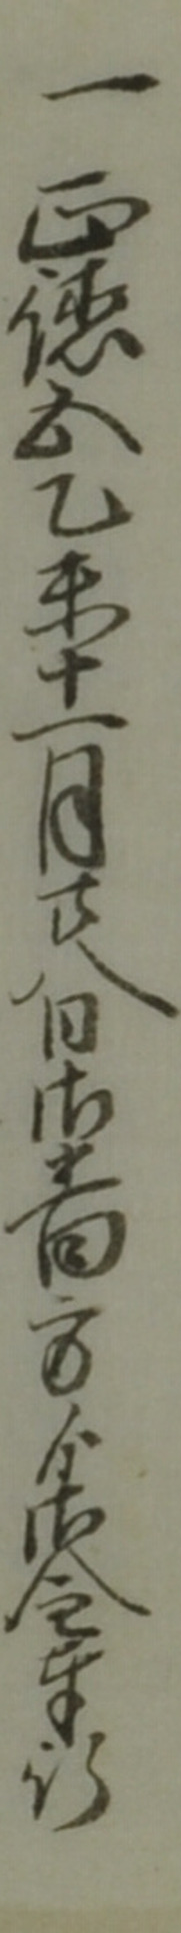一正徳五乙未十一月廿八日御番方より御金奉行
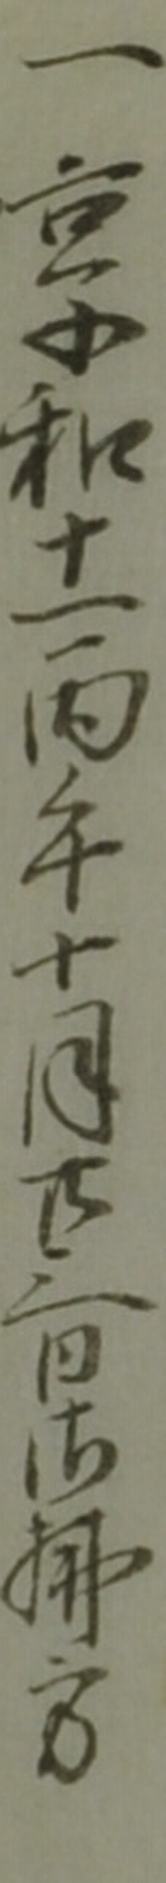一享和十一丙午十一月廿三日御払方
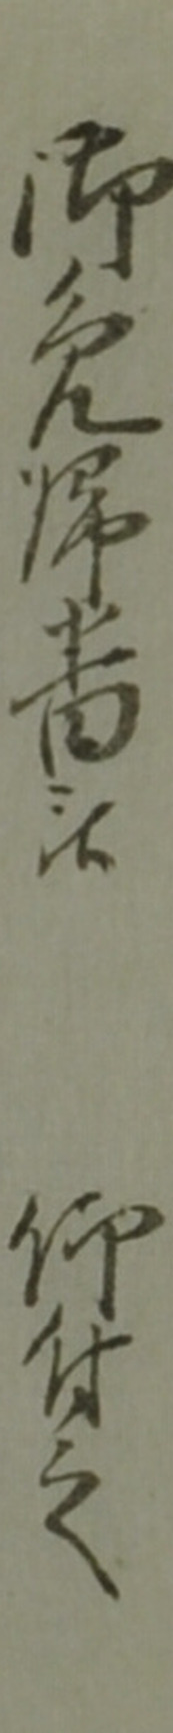御免帰番被仰付之
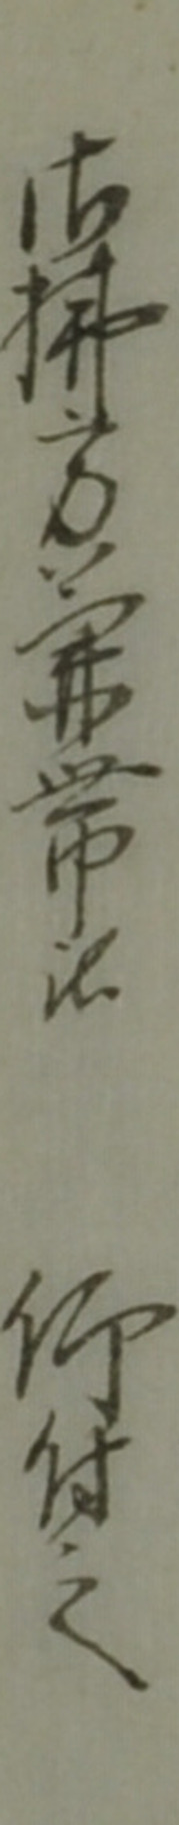御払方兼帯被仰付之
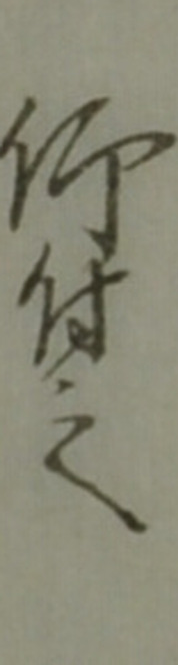仰付之
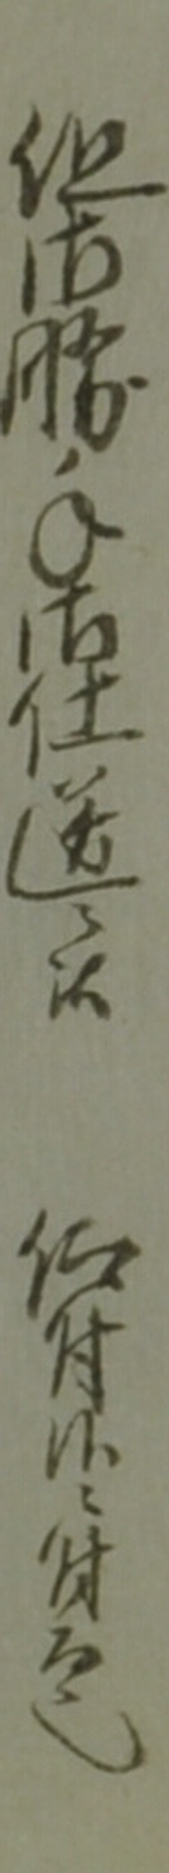但御勝手御仕送に被仰付候に時而已
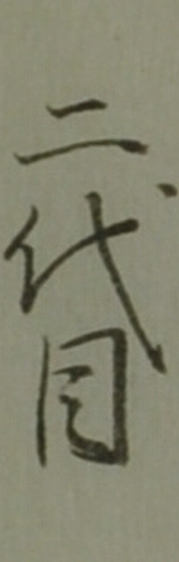二代目
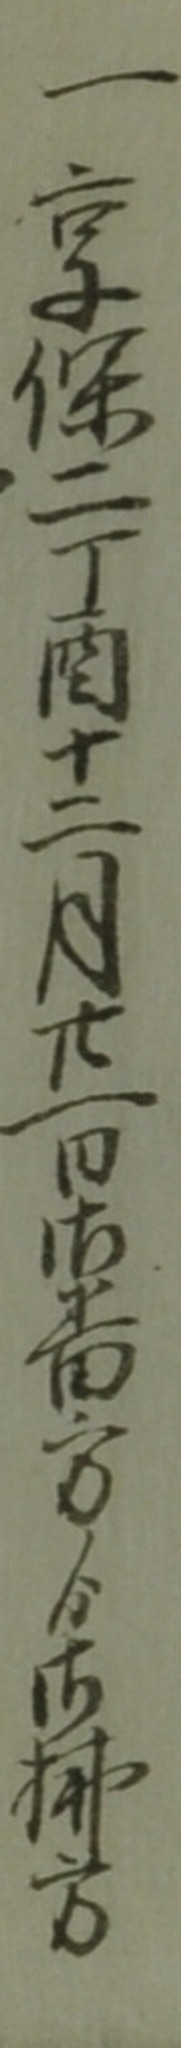一享保二丁酉十二月廿一日御番方より御払方
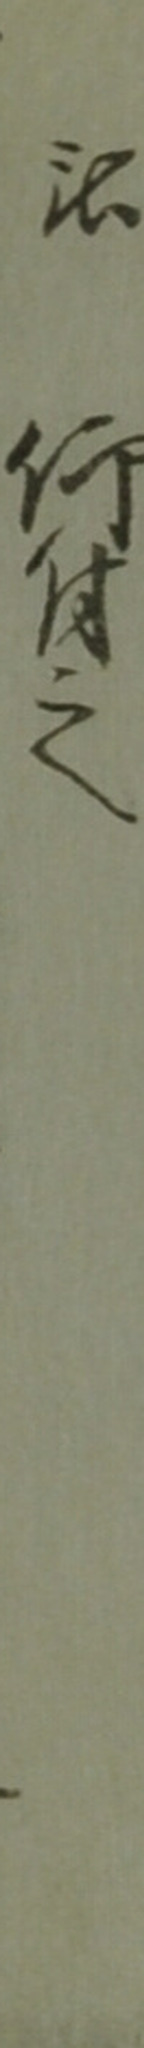被仰付之
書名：諸御役代々録（八）
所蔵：伊那市立高遠町図書館・合同会社AMANE
